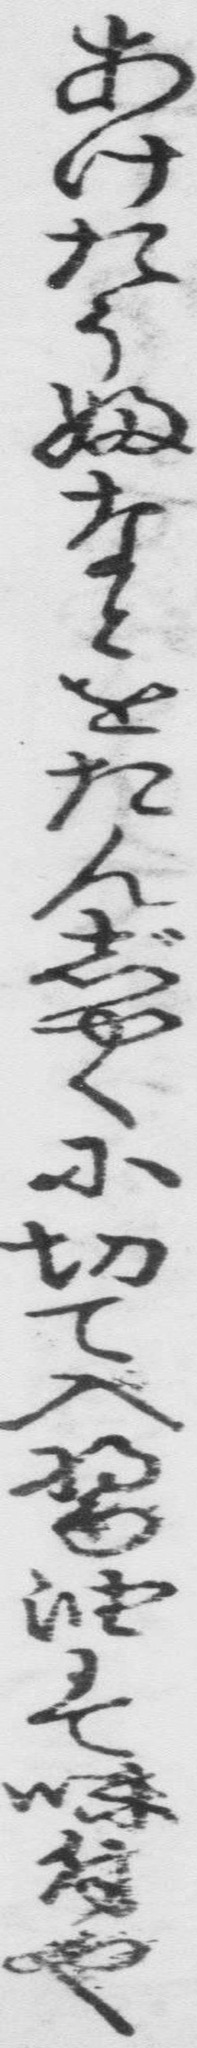あけたう婦なとをたん志やく尓切て入醤油尓て味付也
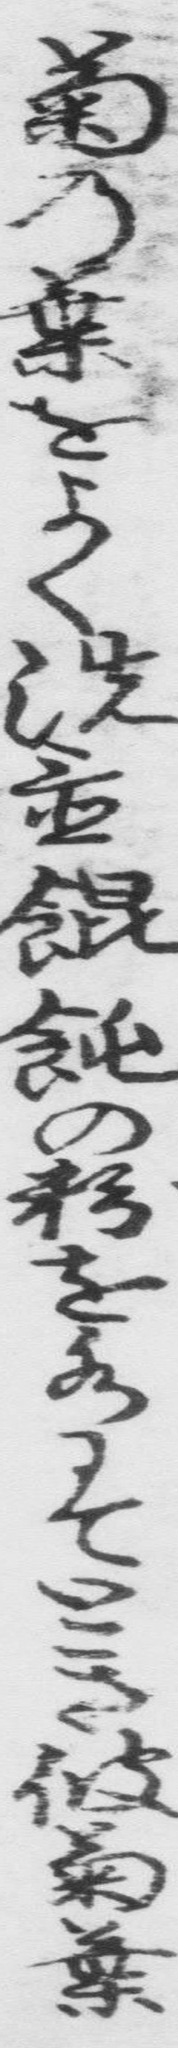菊乃葉をよく洗置饂飩の粉を水尓てとき彼菊葉
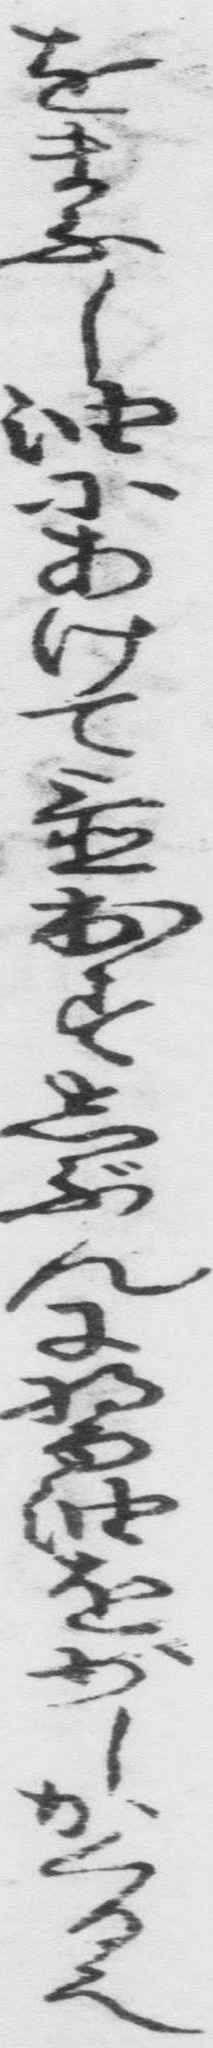をまふし油尓あけて置出春しぶん尓醤油を少しかくる也
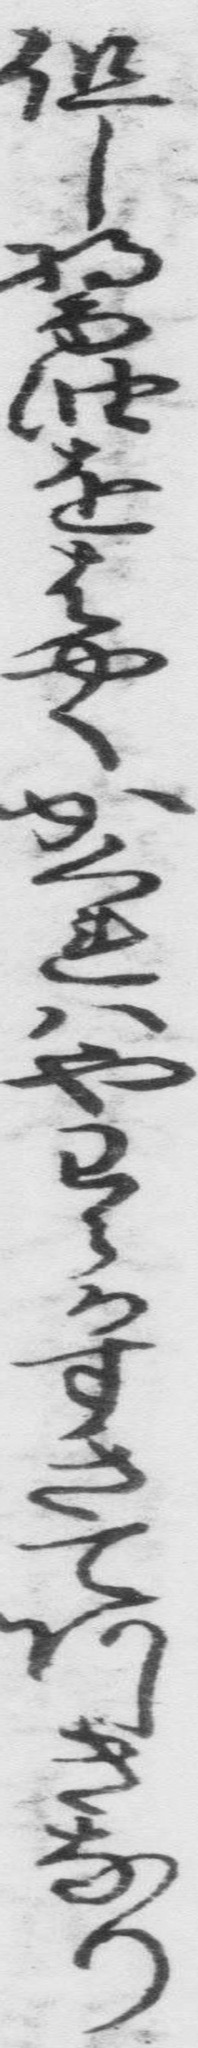但し醤油をはやくかく連はやわらかすきて阿しきなり
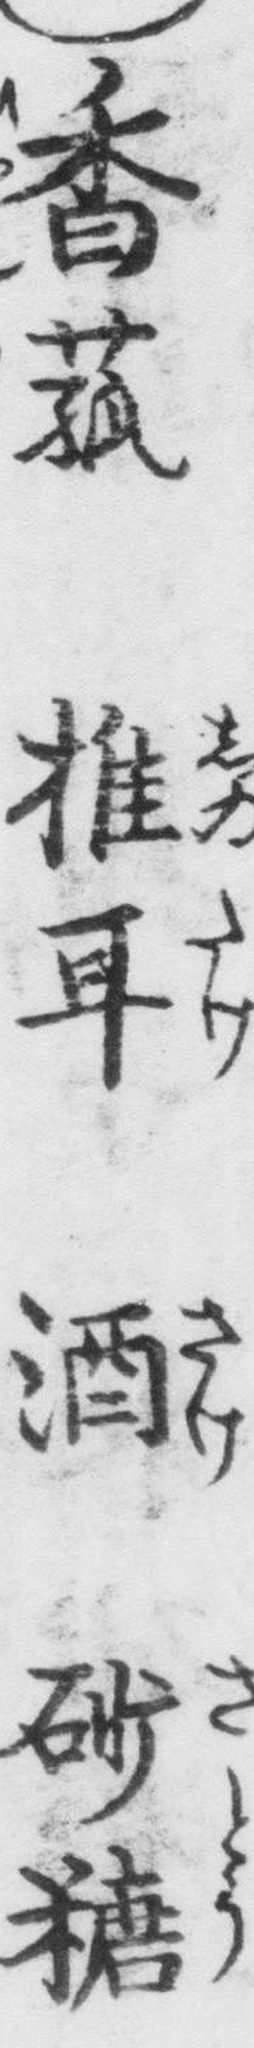〇香菰椎茸酒砂糖
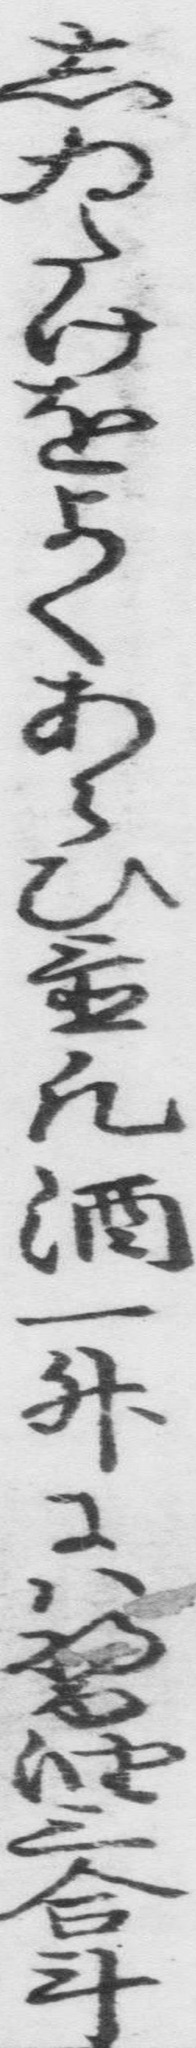志ゐたけをよくあらひ置凡酒一升尓は醤油三合斗
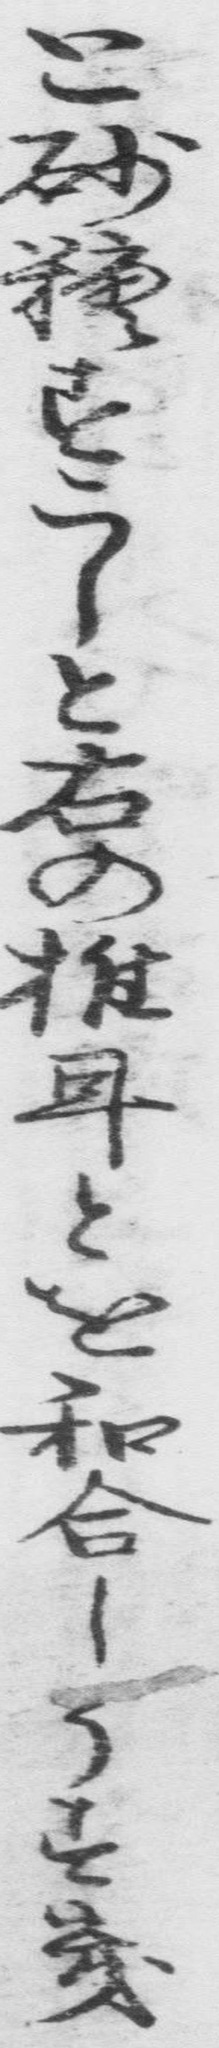と砂糖春こしと右の椎茸とを和合しう春幾
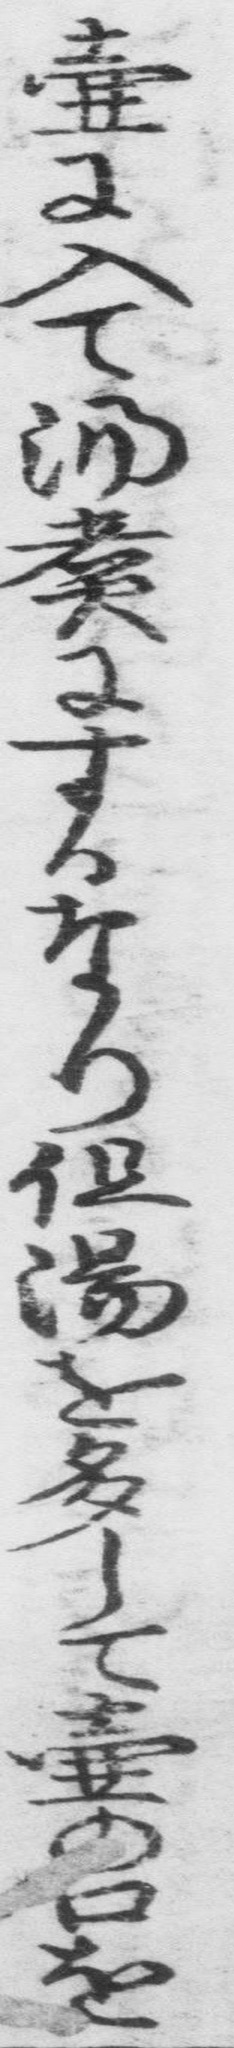壺尓入て湯煮尓するなり但湯を多して壺の口を
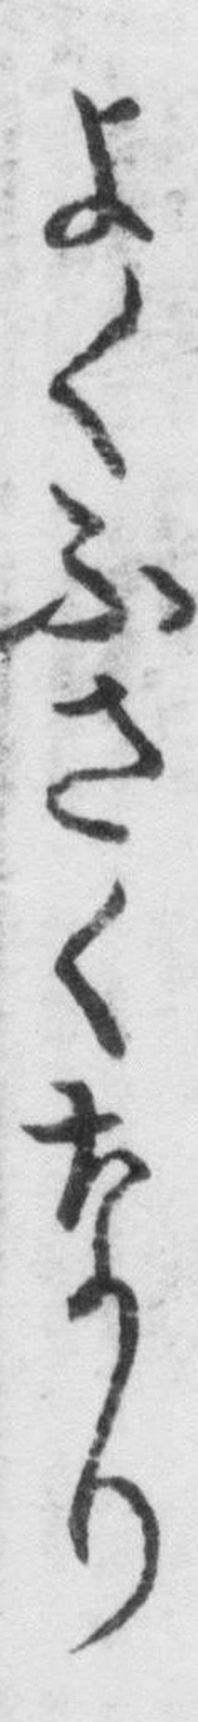よくふさくなり

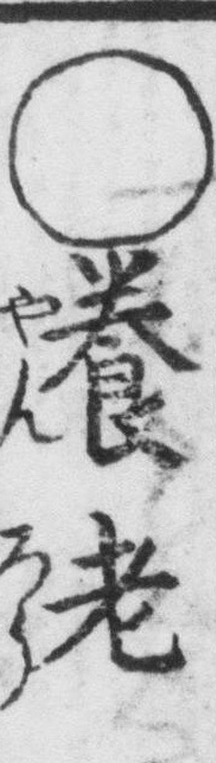〇養老
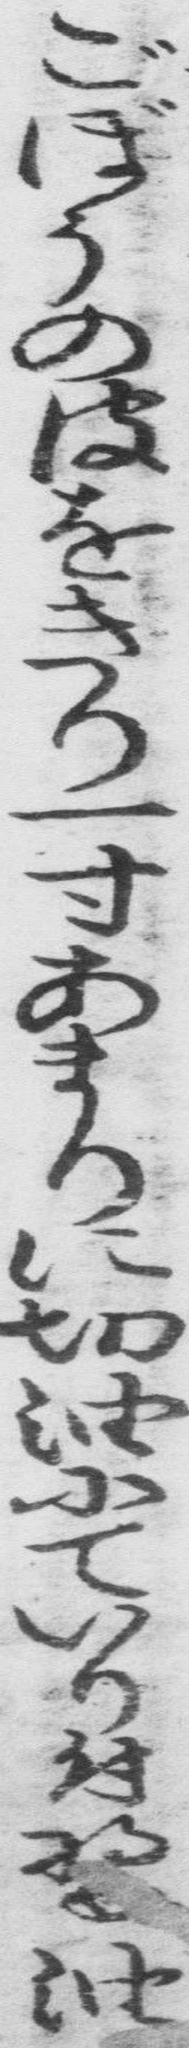ごぼうの皮をきり一寸あまりに切油尓ていり付醤油
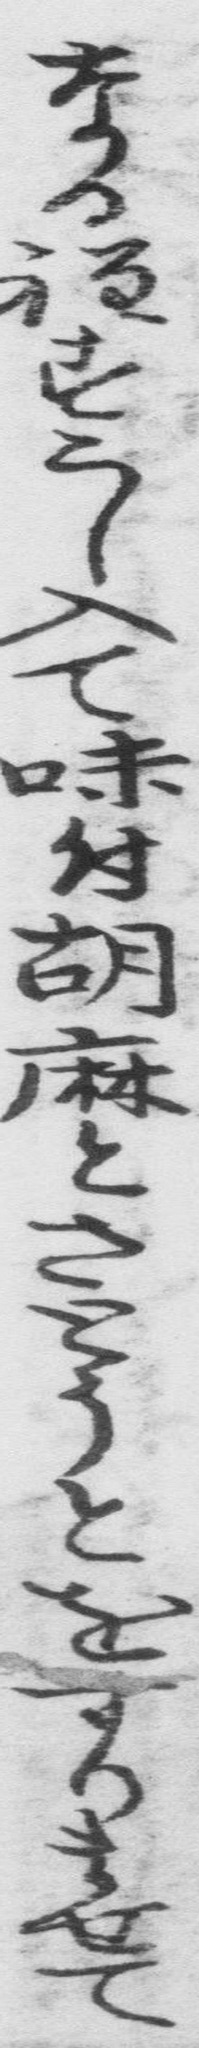なる程春こし入て味付胡麻とさとうとをすりませて
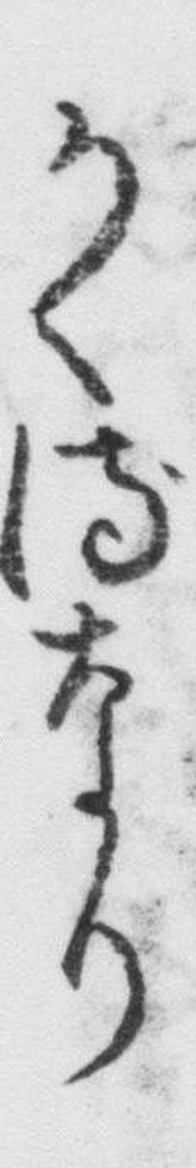かくるなり
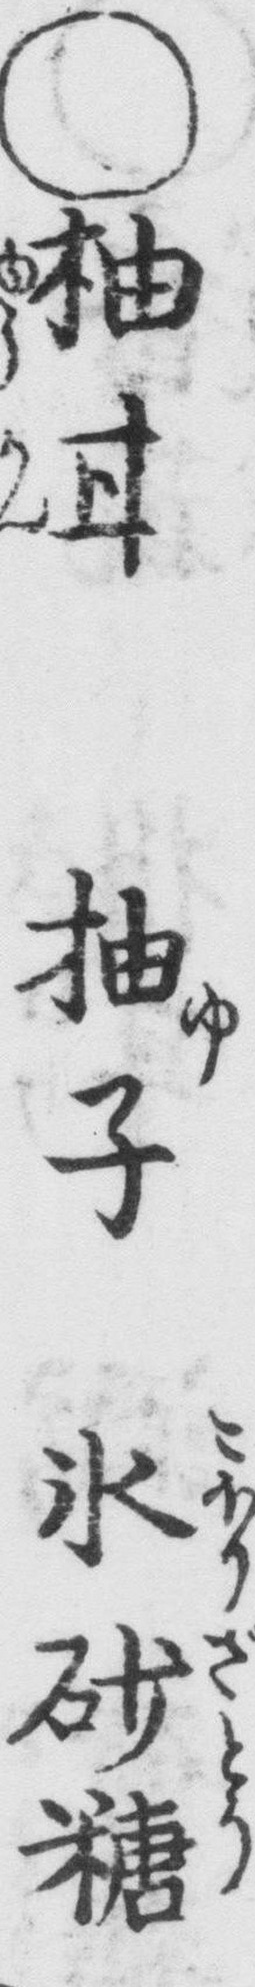〇柚甘柚子氷砂糖
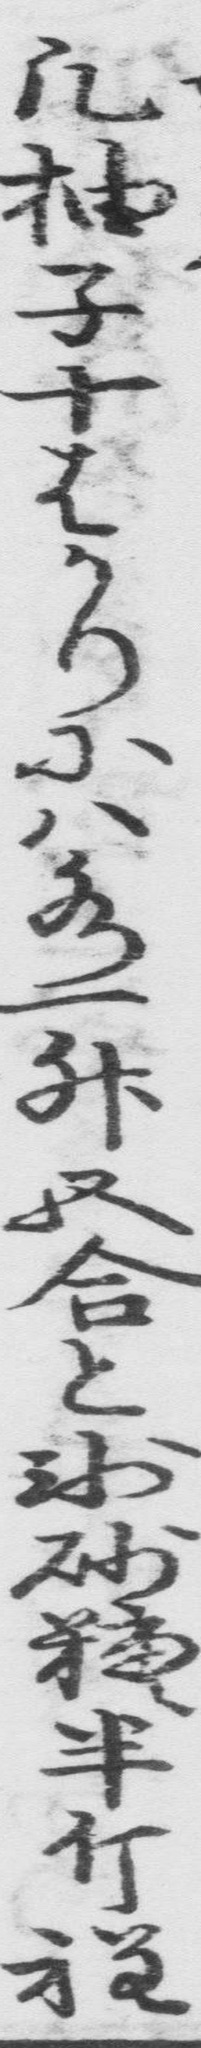凡柚子十はかり尓は水一升五合と氷砂糖半斤程
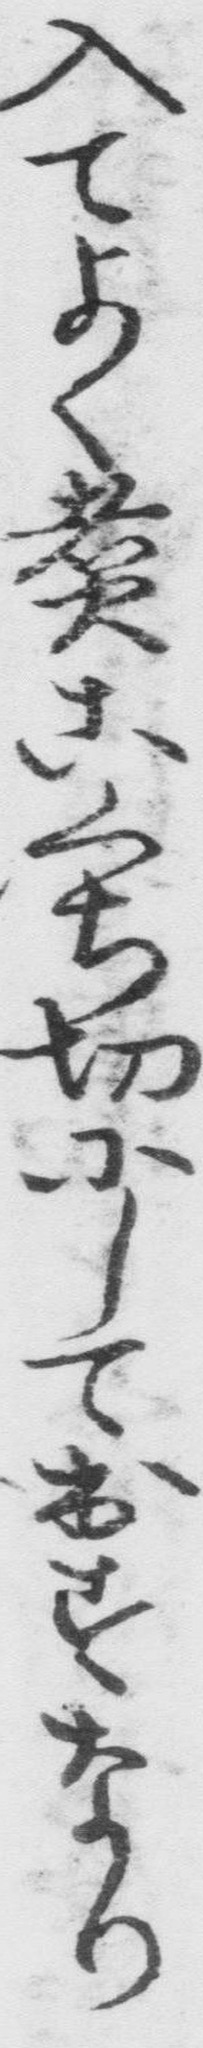入てよく煮古くち切尓して出春なり
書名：普茶料理抄
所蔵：大阪府立大学学術情報センター 国文学研究資料館
